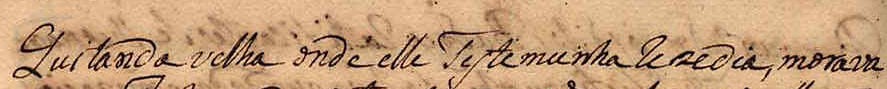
Quitanda velha onde elle Testemunha Rezedia, morava
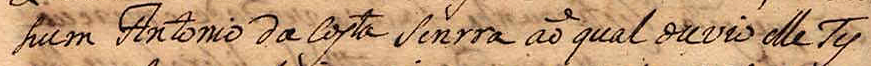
hum Antonio da Costa Senrra ao qual ouvio elle Tes
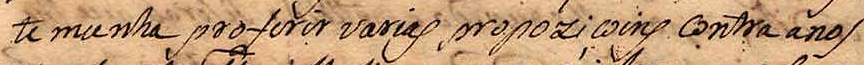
temunha proferir varias propoziçoins contra a nos
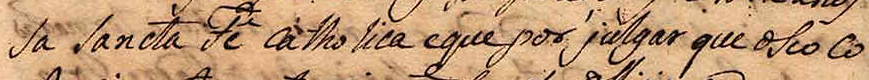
sa sancta Fé catholica, e que por julgar que o seo co
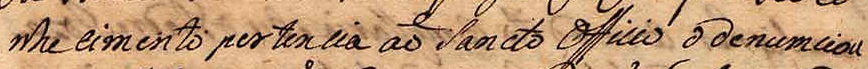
nhecimento pertencia ao Sancto Officio o denunciou
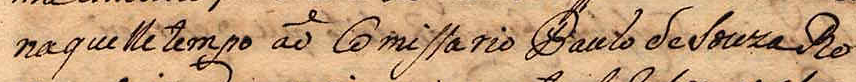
naquelle tempo aó Comissario Paulo de Souza Ro
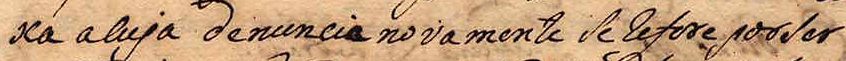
xa a cuja denuncia novamente se Refere por ser
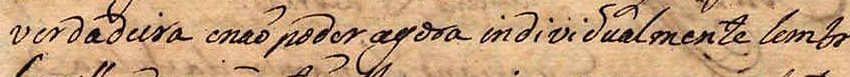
verdadeira e naõ poder agora individualmente lembra
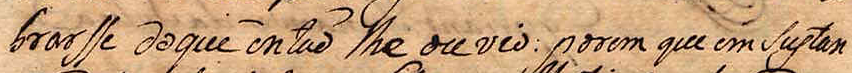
brarsse do que entaõ lhe ouvio: porem que em sustan
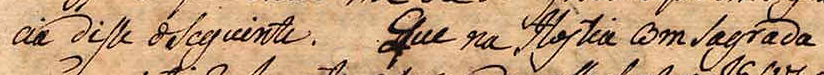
cia disse o seguinte. Que na Hostia com sagrada
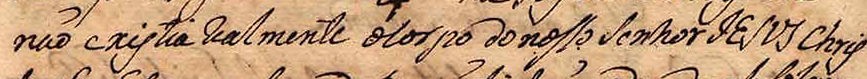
naõ exista Realmente o corpo de nosso Senhor IESVS Chris
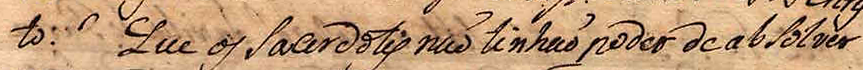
to: Que os Sacerdotes naõ tinhaõ poder de absolver
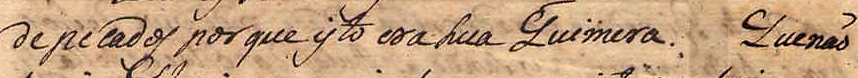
de pecados porque isto era hua Quimera. Que naõ
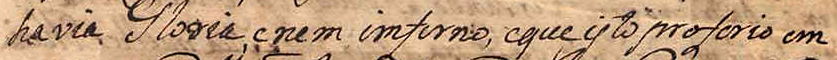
havia Gloria, e nem imferno, e que isto proferio em
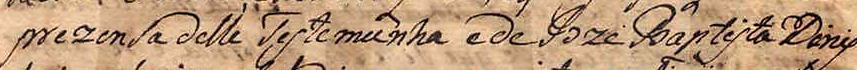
prezensa delle testemunha e de Ioze Baptista Dinis
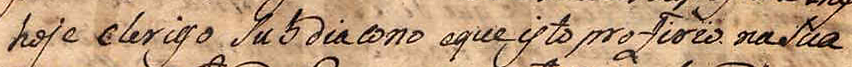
hoje clerigo sub diacono e que isto profirio na sua
